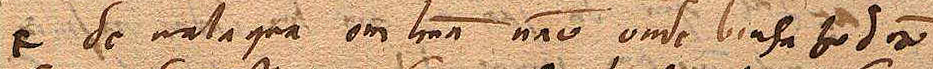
R de malaqua em hūa nao onde vinha ho dito
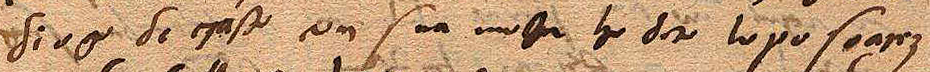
diogo de crasto com sua molher ho dito lopo soarez
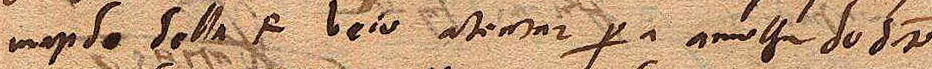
marido della R veio atentar ꝑa a molher do dito
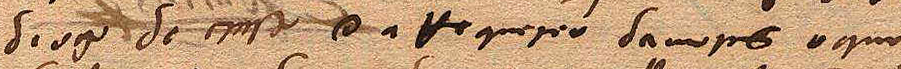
diogo de crasto e a Requereo damores o que
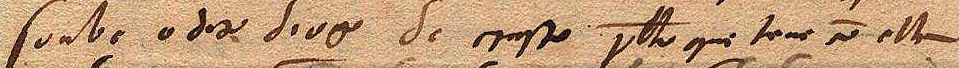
soube o dito diogo de crasto ꝑllo que teue cō elle
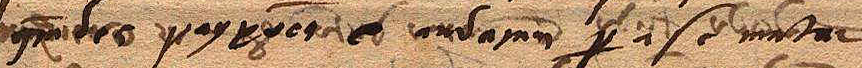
gr̄ades payxões e andaram ꝑa se matar
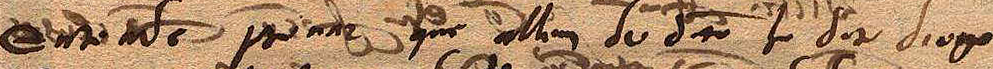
Entende prouar que allem do dito ho dito diogo
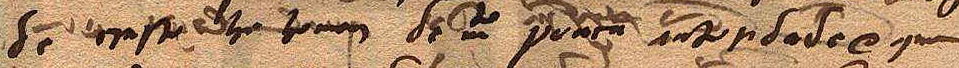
de crasto he homem de mto pouca autoridade e que
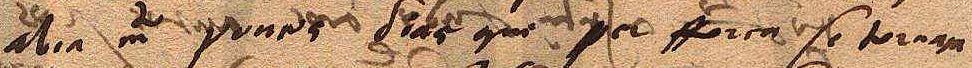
avia mto poucos dias que per fforca se tornara
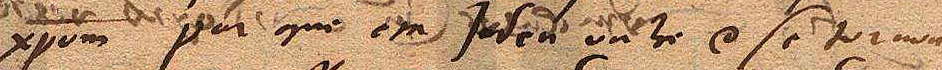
xp̄om por que era Judeu ou he e se tornou
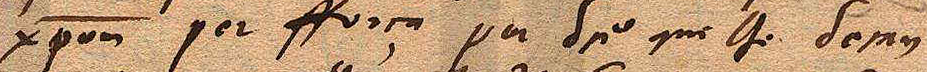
xp̄om per fforça por drro que lhe deram
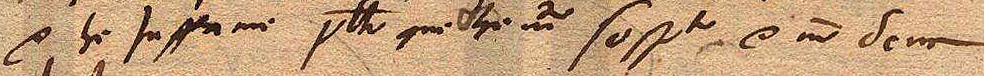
e he Jnffame p̄llo que he mto sospto e nō deue
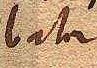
valer
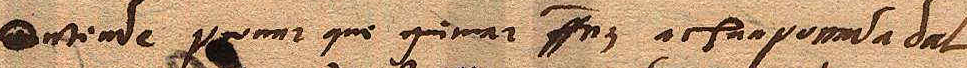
Entende prouar que guimar f̄frrz a chanporrada dal
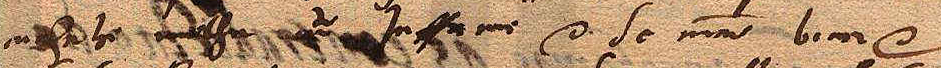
cunha he molher mto Jnffame e de mao viuer e
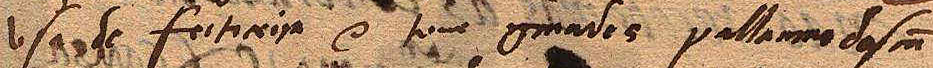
vsa de feiticeira e teue grandes pallauras descā
